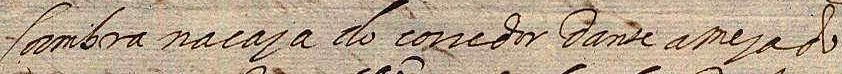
Coimbra na caza do corredor dante a meza do
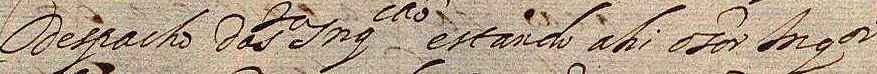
Despacho da sta Inqcão estando ahi o so̅r Inqor
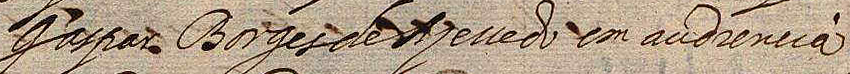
Gaspar Borges de Azevedo em audiencia
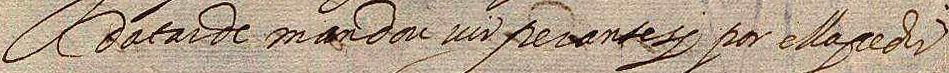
da tarde mandou uir perante sj por ella pedir
